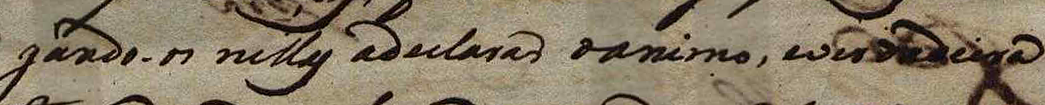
gando-os nellas a declarar o animo, e verdadeira
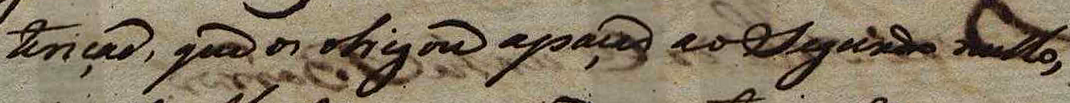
tençaõ, que os obrigou a paçar ao Segundo nullo,
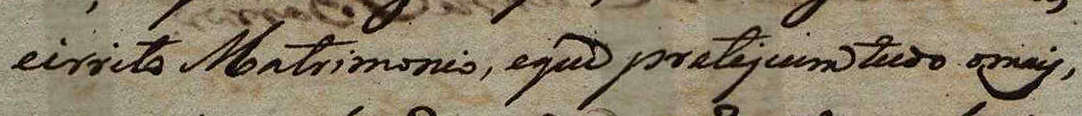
e irrito Matrimonio, e que pratejcam tudo o mais,
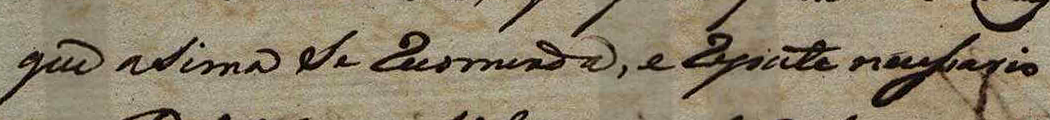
que asima Se Recomenda, e Repute necessario
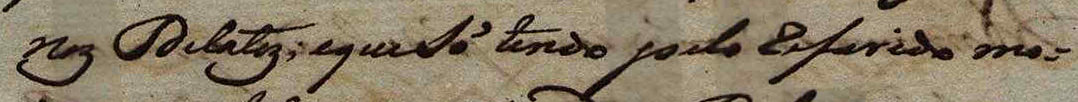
noz Delatoz; e que Só tendo pelo Referido mo
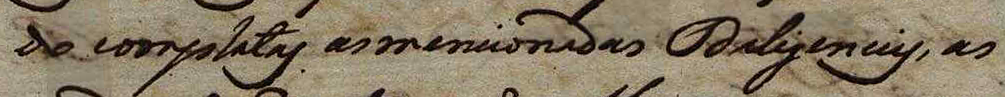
do completas as mencionadas Deligencias, as
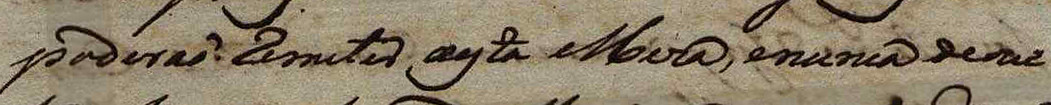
poderaõ Remeter a esta Meza, e nunca de ou
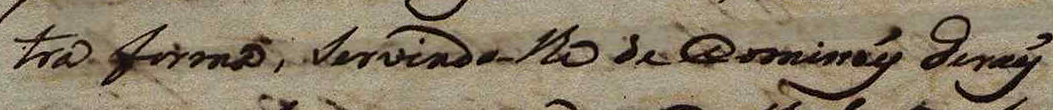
tra forma, servindo-lhe de Comissoẽs Geraés
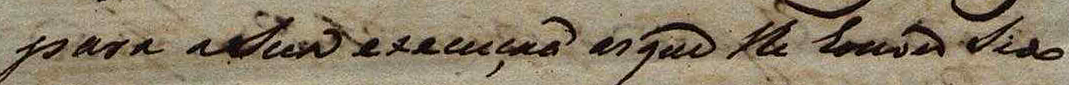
para a Sua execuçaõ as que lhe houver sido
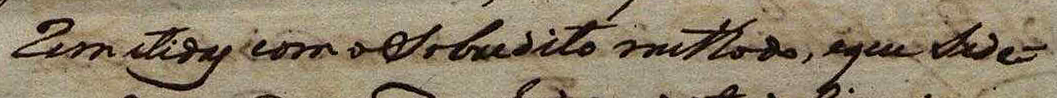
Remetidas com o Sobredito methodo, e que se de
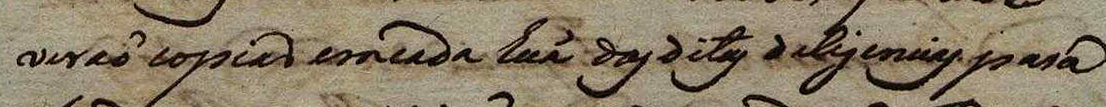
veraõ copiar em cada huā das ditas deligencias para
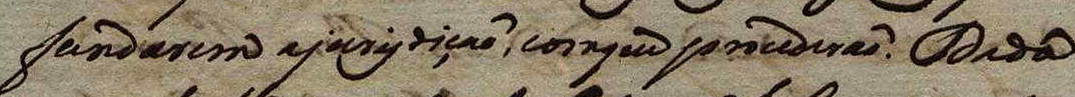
fundarem a jurisdiçaõ, com que procederaõ. Dada
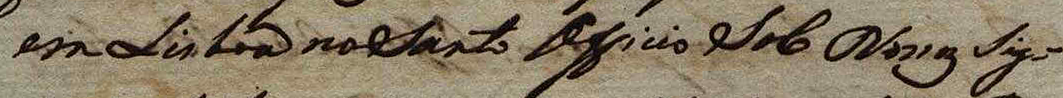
em Lisboa no Santo Officio Sob Nossoz sig
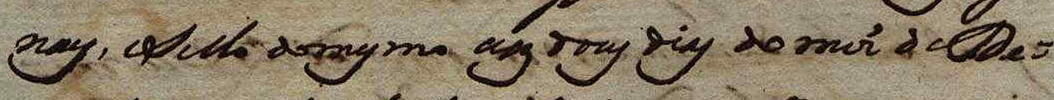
nais, e Sello do mesmo aoz dous dias do méz de De
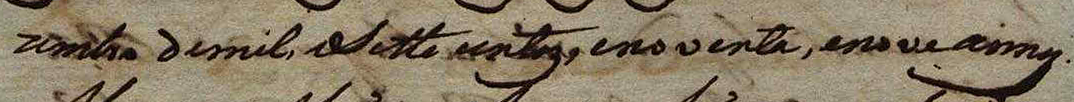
zembro de mil, e Settecentos, e noventa, e nove annos.
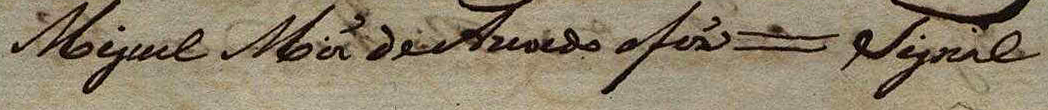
Miguel Miz̄. de Azevedo o fiz =Signal
